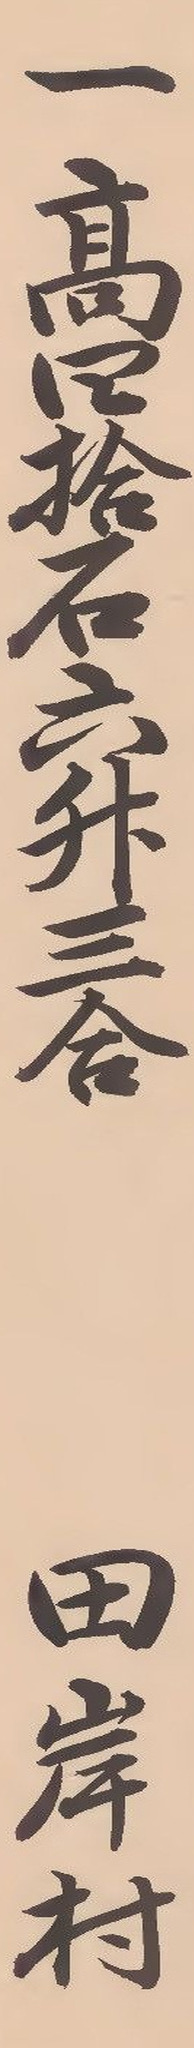一高四拾石六升三合田岸村
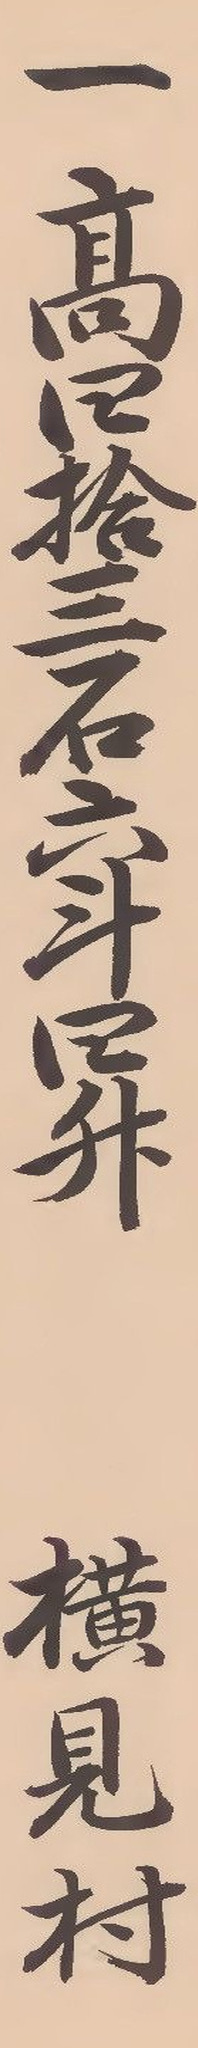一高四拾三石六斗四升横見村
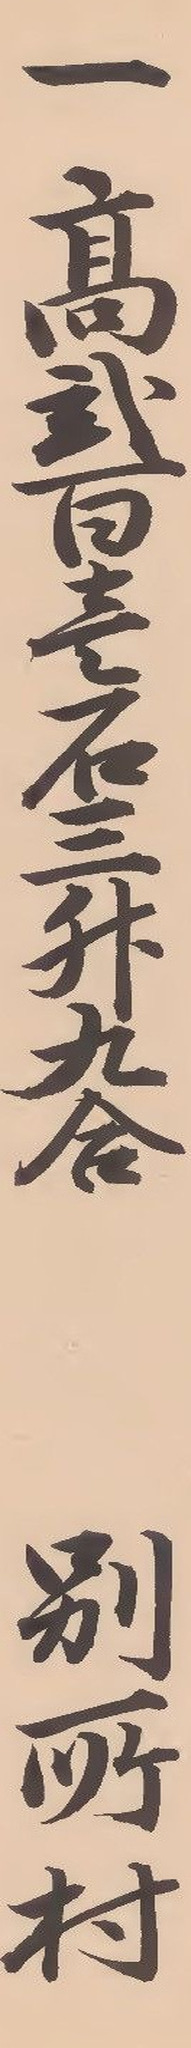一高弐百壱石三升九合別所村
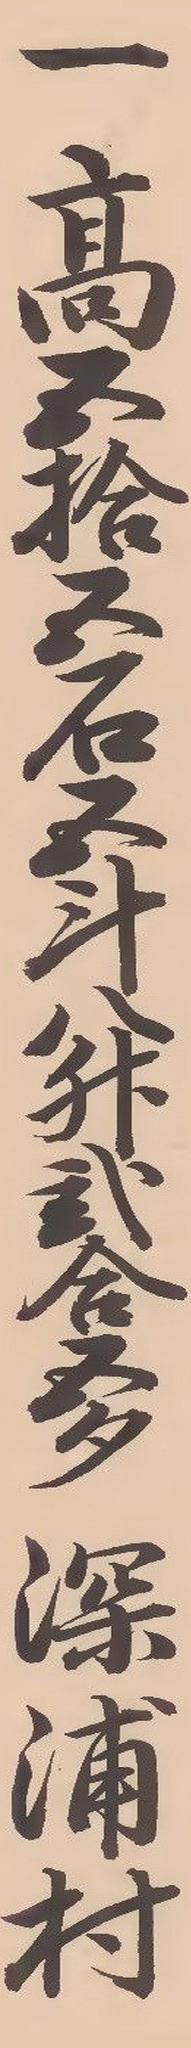一高五拾五石五斗八升弐合五勺深浦村

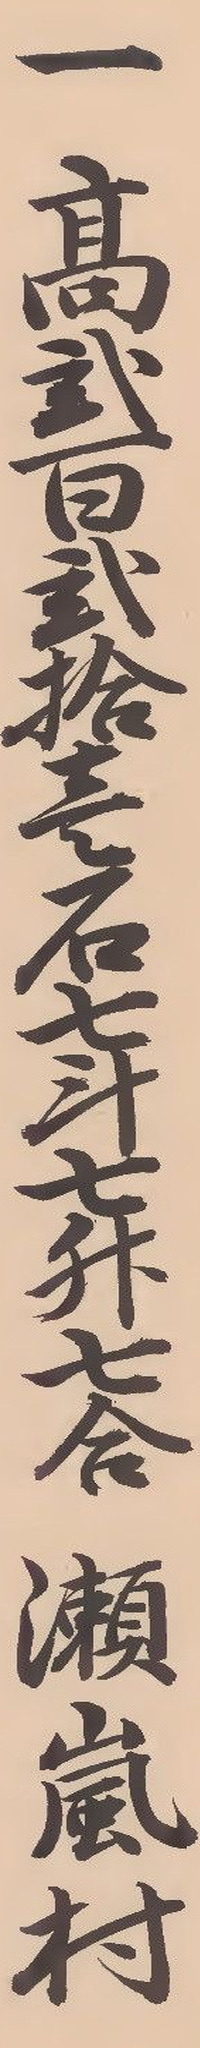一高弐百弐拾壱石七斗七升七合瀬嵐村
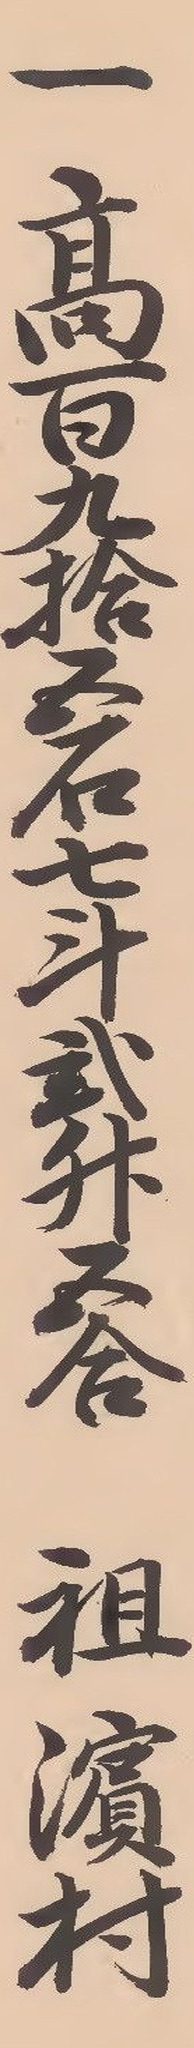一高百九拾五石七斗弐升五合祖浜村
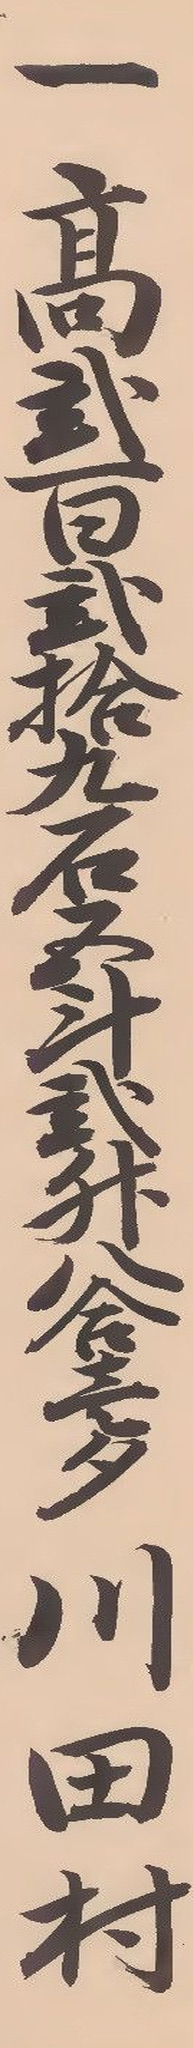一高弐百弐拾九石五斗弐升八合壱勺川田村
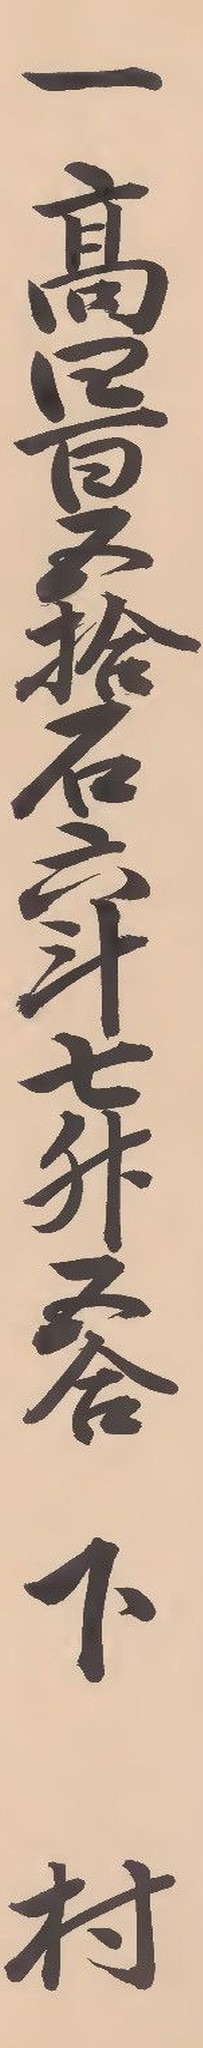一高四百五拾石六斗七升五合下村
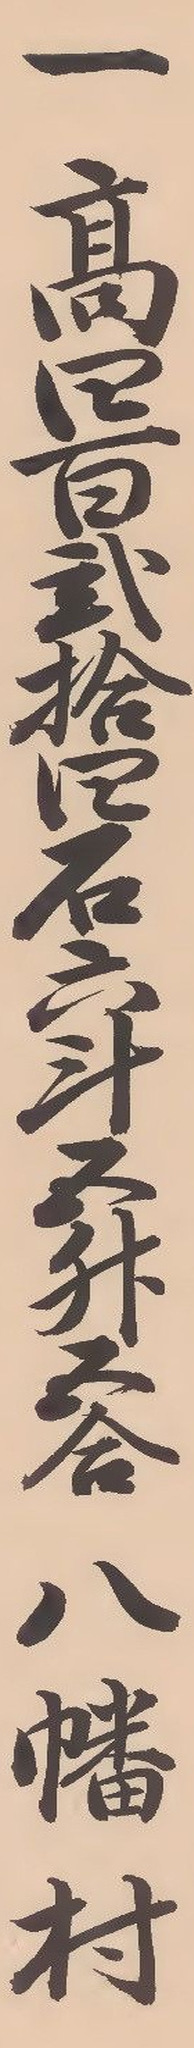一高四百弐拾四石六斗五升五合八幡村
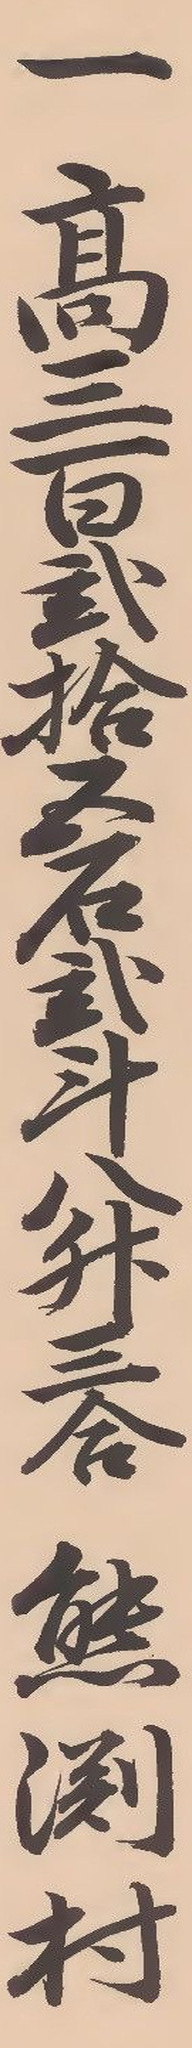一高三百弐拾五石弐斗八升三合熊淵村
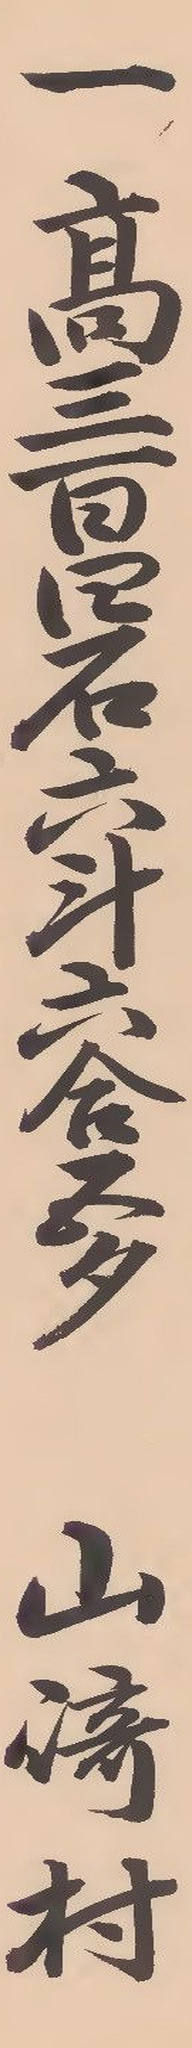一高三百四石六斗六合五勺山崎村

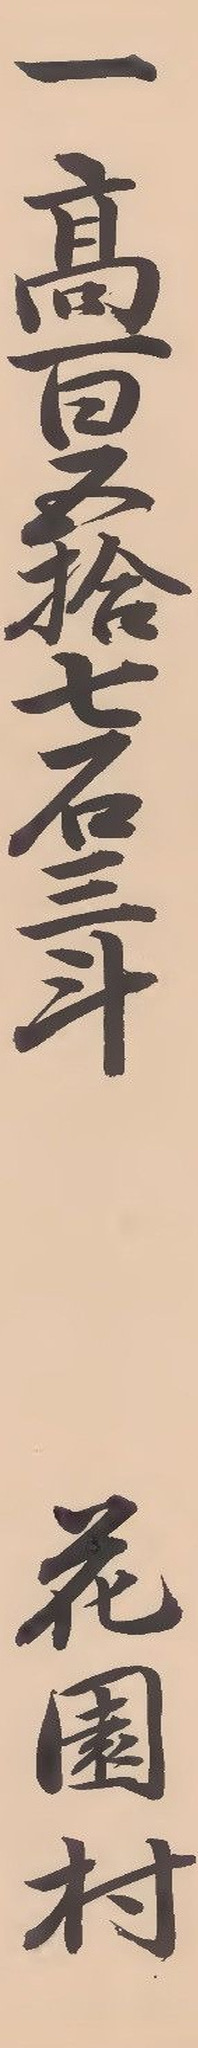一高百五拾七石三斗花園村
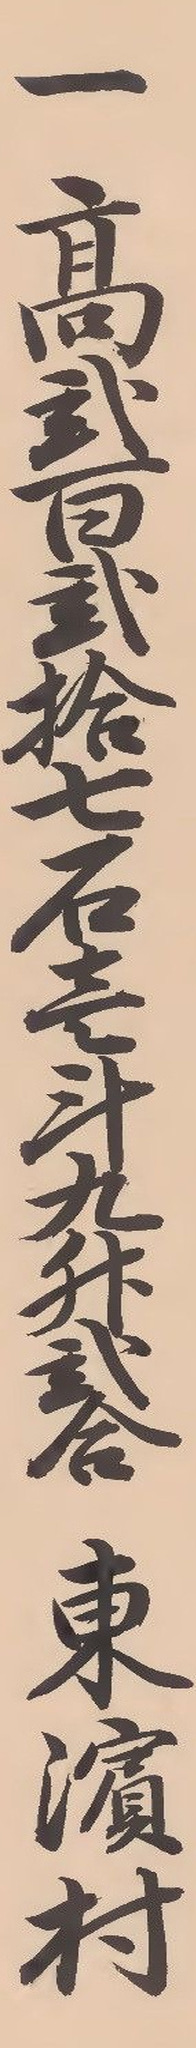一高弐百弐拾七石壱斗九升弐合東浜村
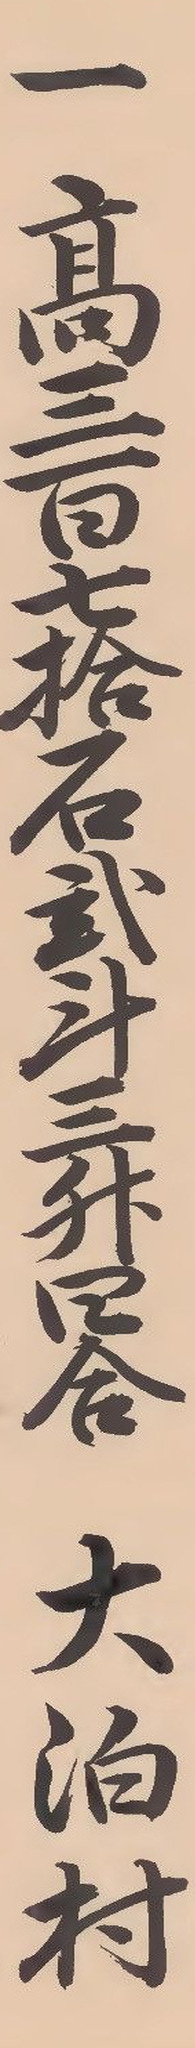一高三百七拾石弐斗三升四合大泊村
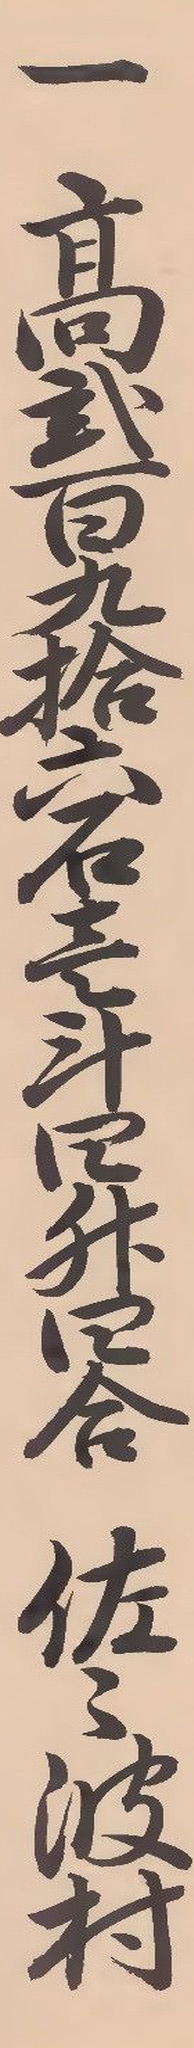一高弐百九拾六石壱斗四升四合佐々波村
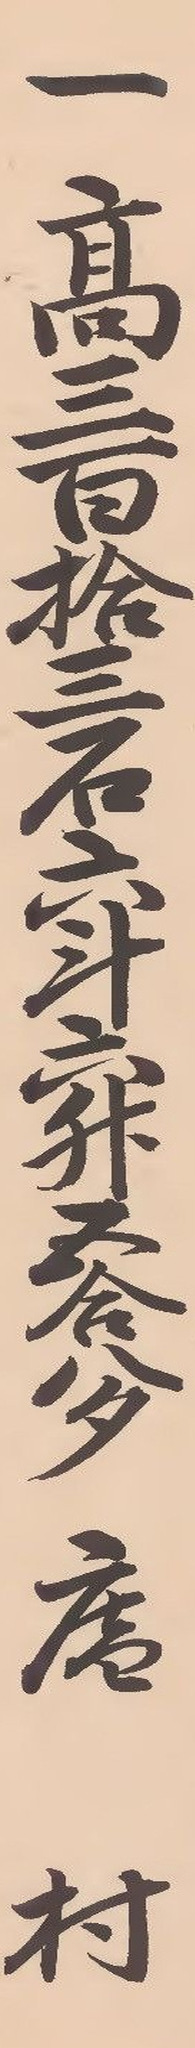一高三百拾三石六斗六升五合八勺庵村
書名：能登国郷帳
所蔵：国立公文書館 National Archives of Japan
